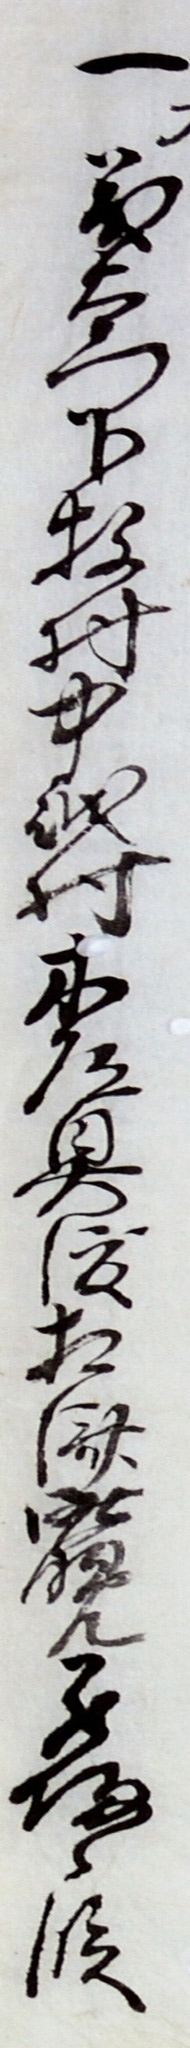一義右衛門下牧村中越村木道具渡相済昨晩罷帰候段

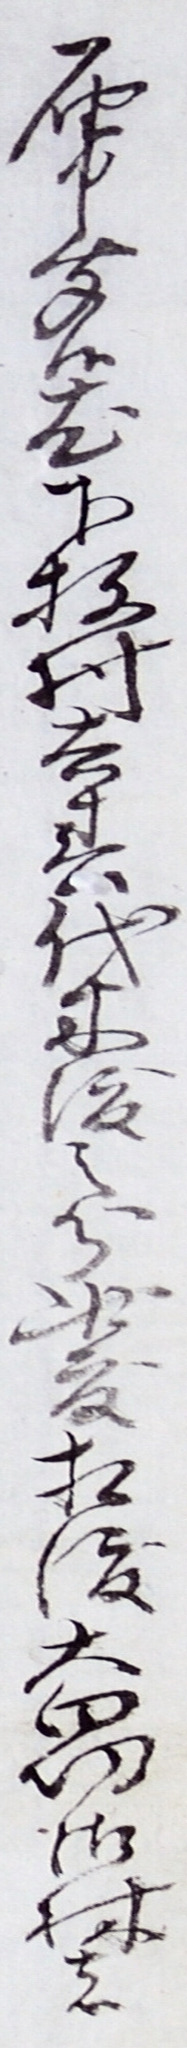届申聞候尤下牧村去春代木渡之分此度相渡大田切御林は
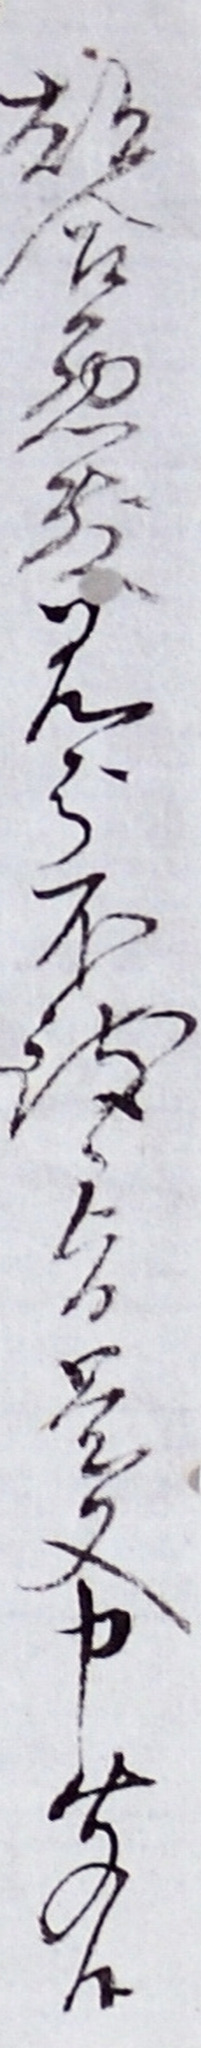都合悪敷見分不致候旨是又申聞候
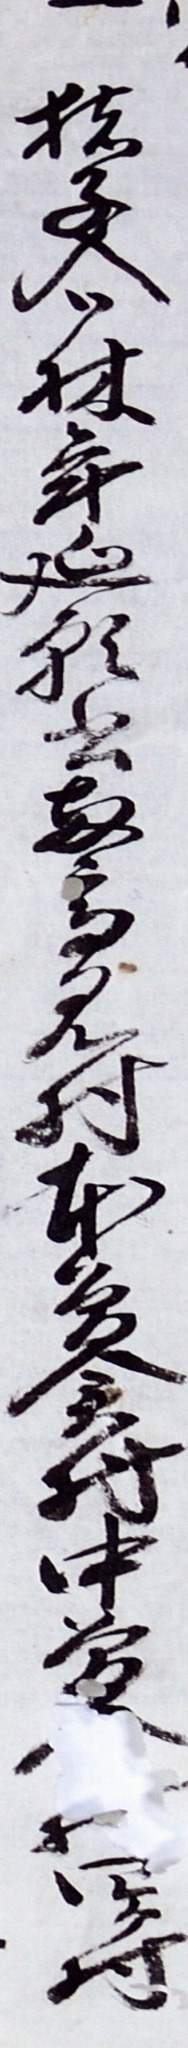一猪子入御林年延願書両高見村本曽倉村中曽村四ヶ村
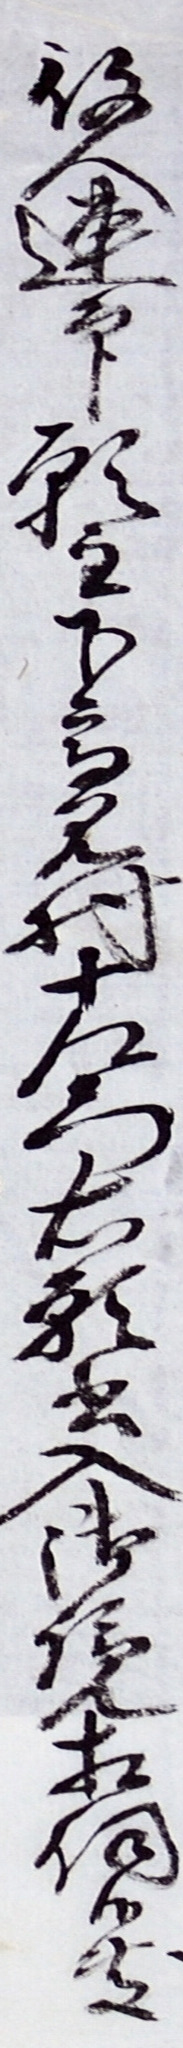役人連印願主下高見村十左衛門右願書入御覧相伺候処
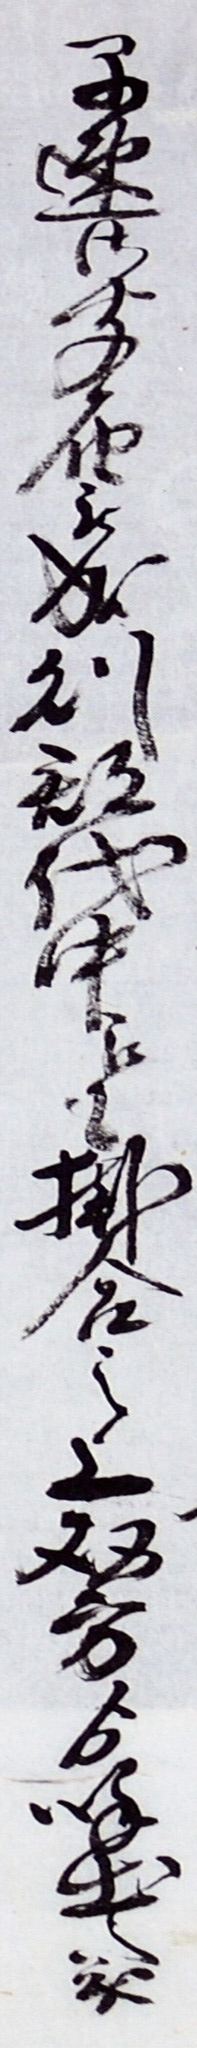早速御聞届被成則郡代中江も掛合之上双方より呼出之義
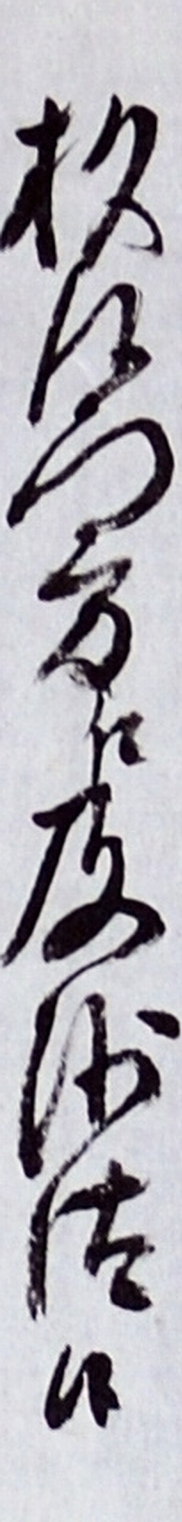杉左衛門方江及沙汰候
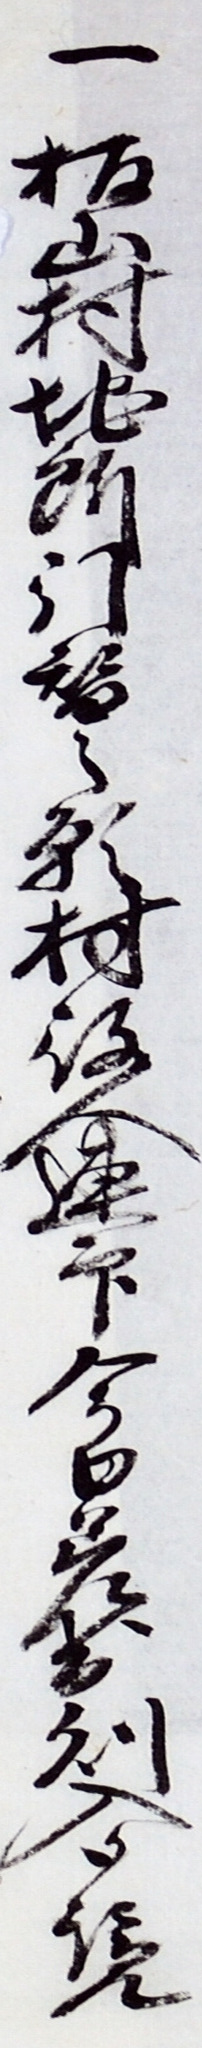一板山村地所引替之願村役人連印今日差出刻則入御覧
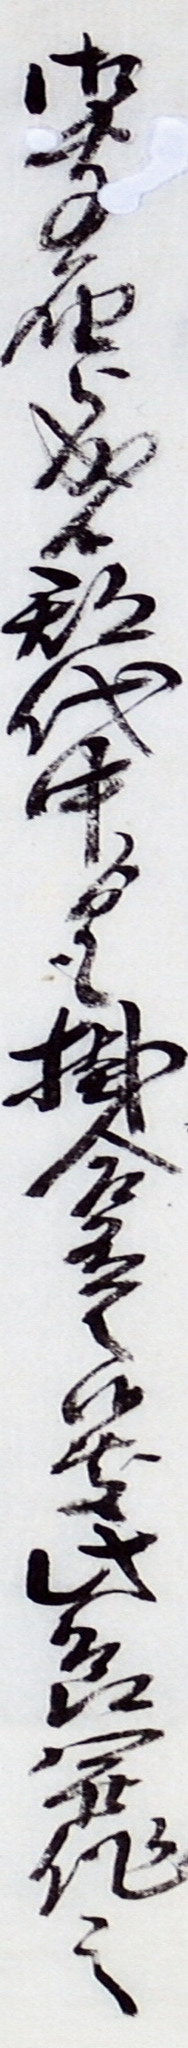御聞届被成候郡代中よりも掛合有之候処此節開作之
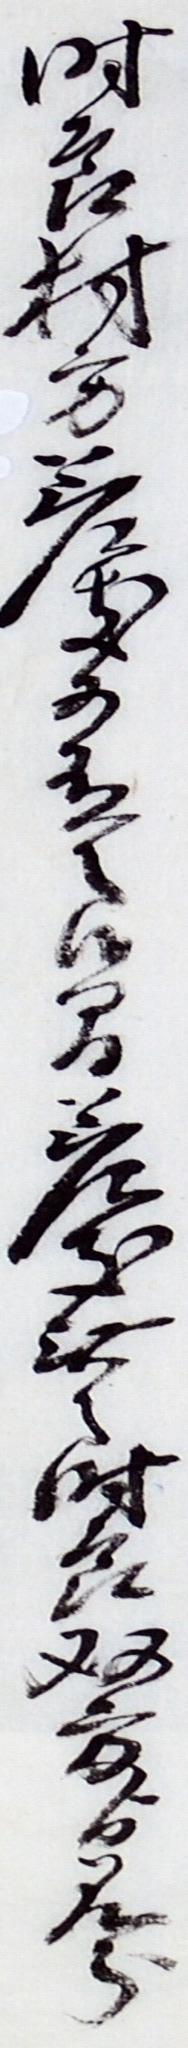時節村方差支可有之候間差支無之時節双方より見分
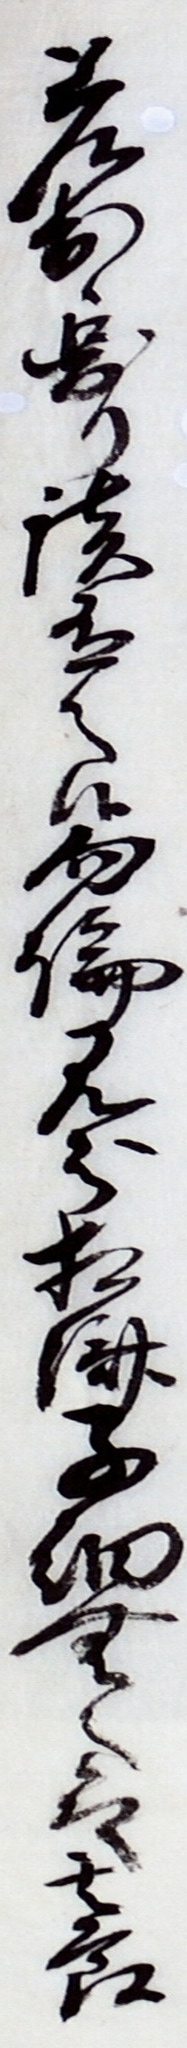差出候図り談有之候勿論見分相済子細無之候は其節
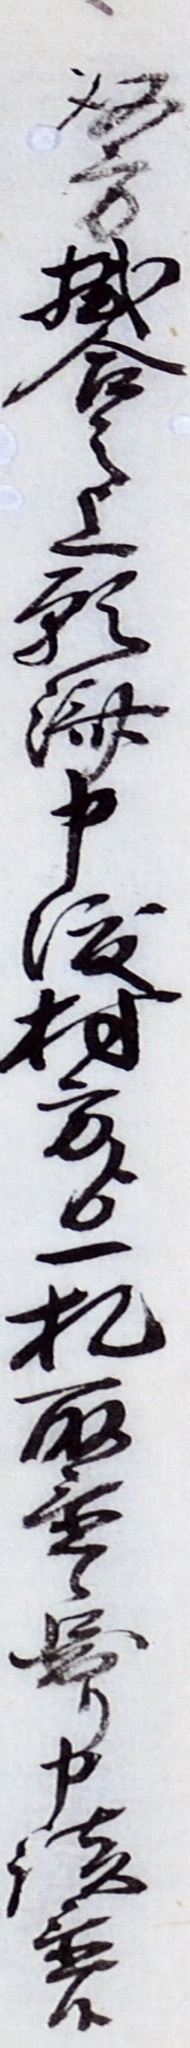双方掛合之上願済申渡村方より一札取置候図り申談置候
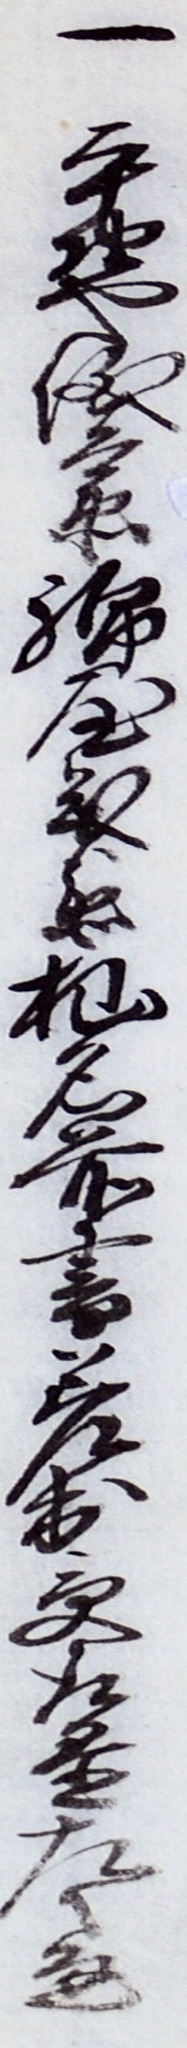一平野や儀兵衛綿屋義兵衛杣名前書差出受取置左之通
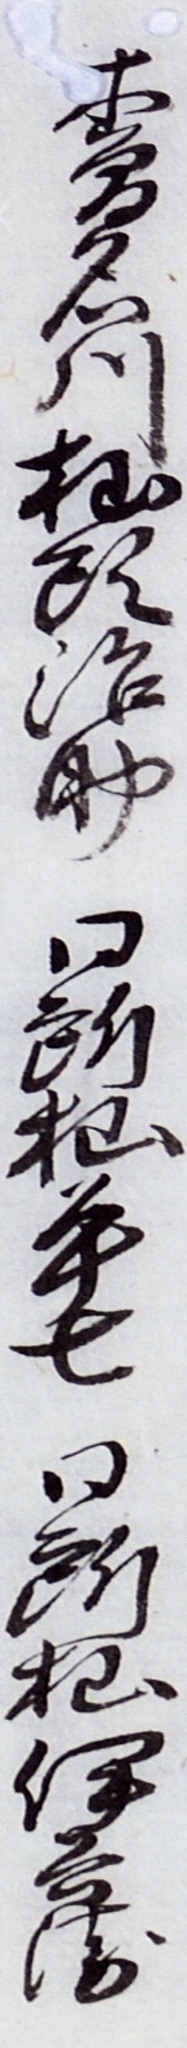木曽名川杣頭治助同所杣平七同所杣伊兵衛
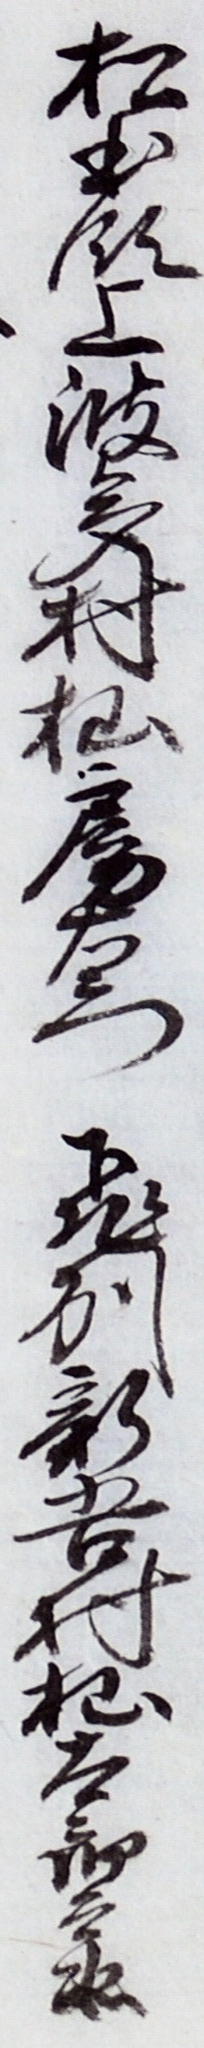松本領上波多村杣房右衛門飛州新吾村杣太郎兵衛
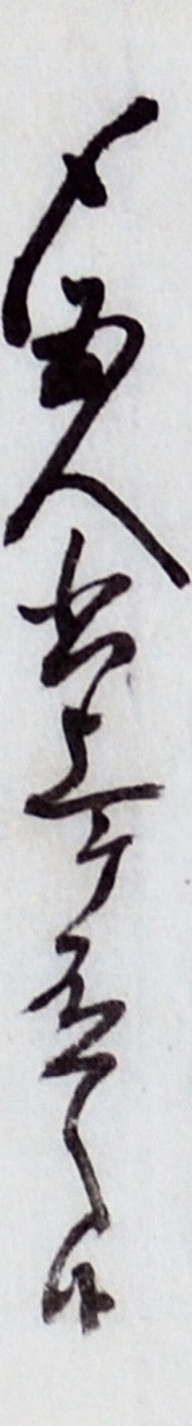〆五人書上ヶ有之候
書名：御山奉行御用控
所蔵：伊那市立高遠町図書館・合同会社AMANE
